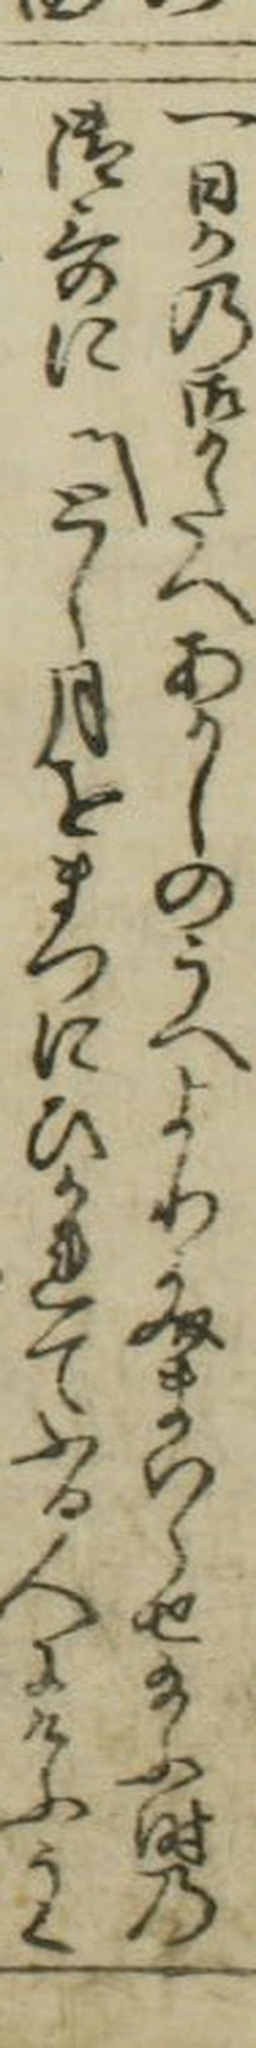御哥に〽とし月をまつにひかれてふる人にけふうく
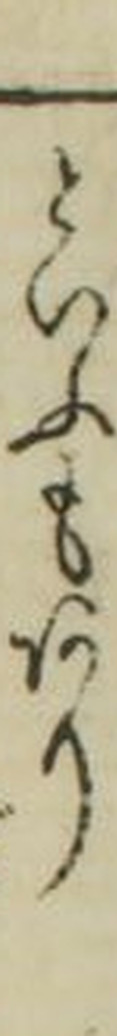といふもあり
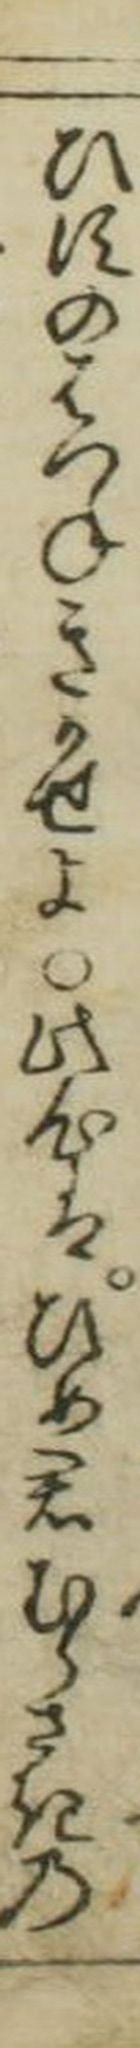ひすのはつねきかせよ○此心は。ひめ君むらさきの
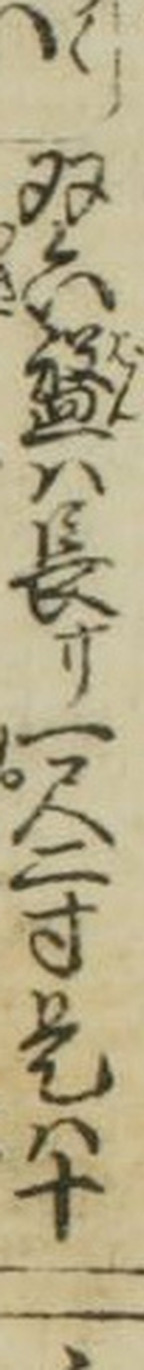双六盤は長一尺二寸是は十
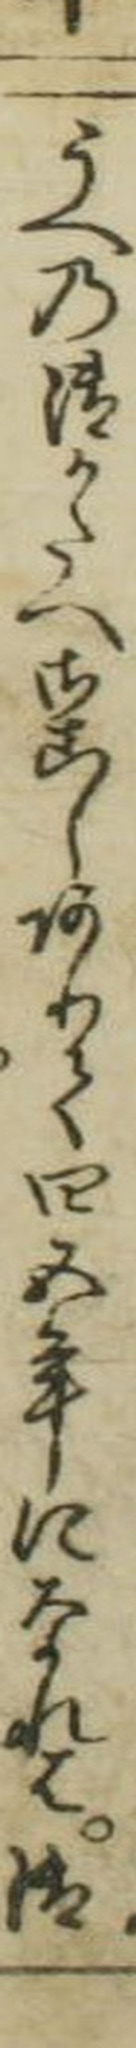うへの御かたへ御こしありて四五年になれは。御
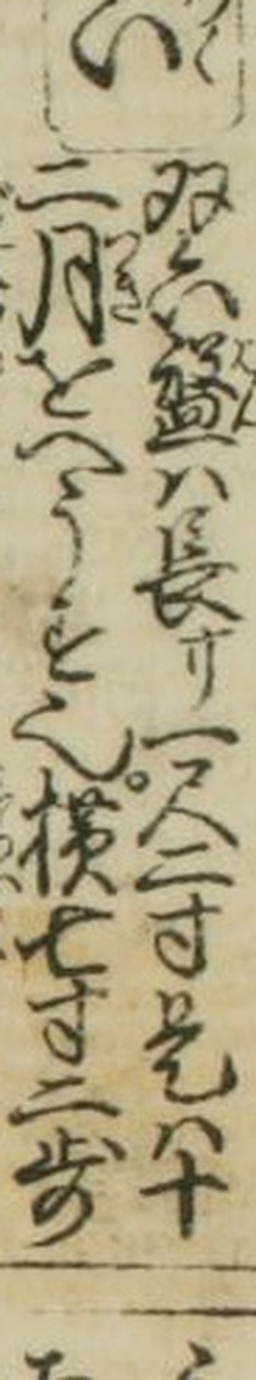二月をへうす也。横七寸二歩
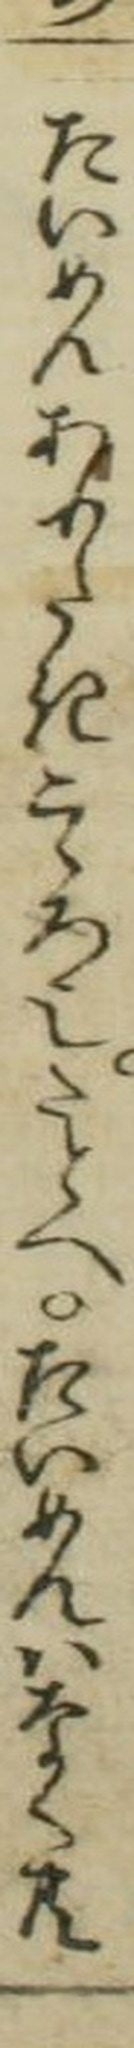たいめんありたきこゝろ也。たとへ。たいめんはなく共
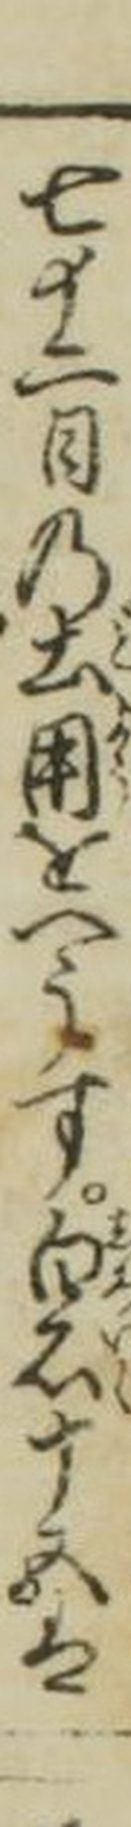七十二日の土用をへうす。白石十五は
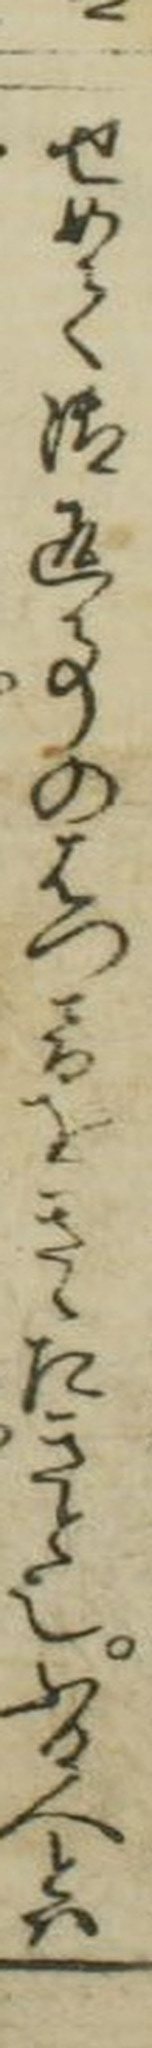せめて御返事のはつ音をきゝたきと也。ふる人とは
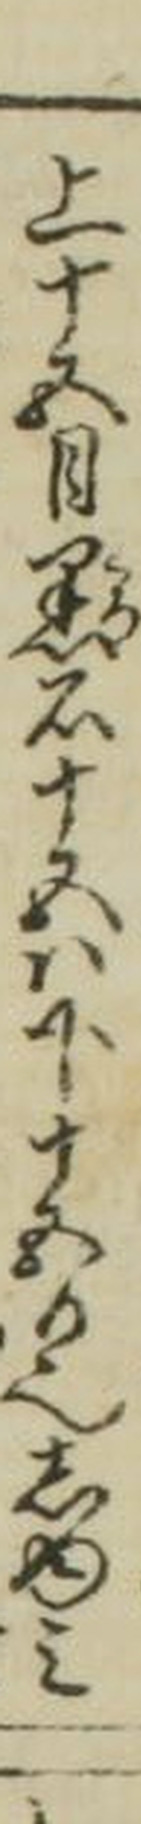上十五日黒石十五は下十五日也。しゆみ
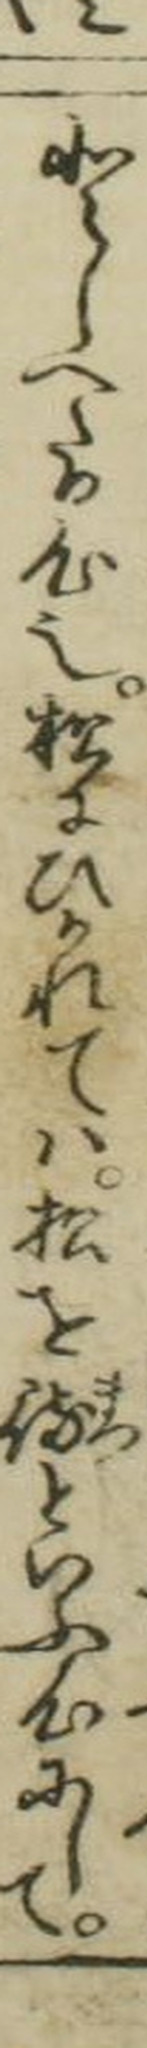としへたる心也。松にひかれては。松を待といふ心にして。
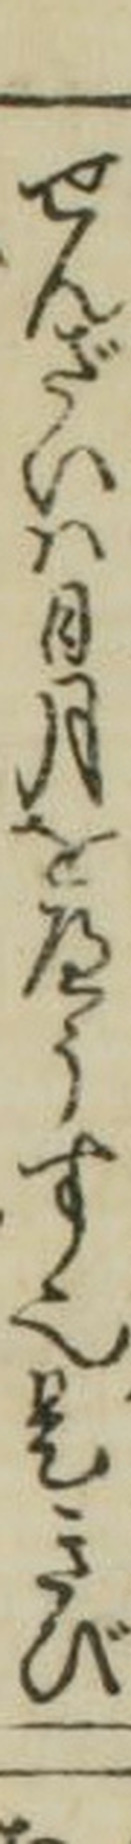せんざいは日月をへうす也是きび
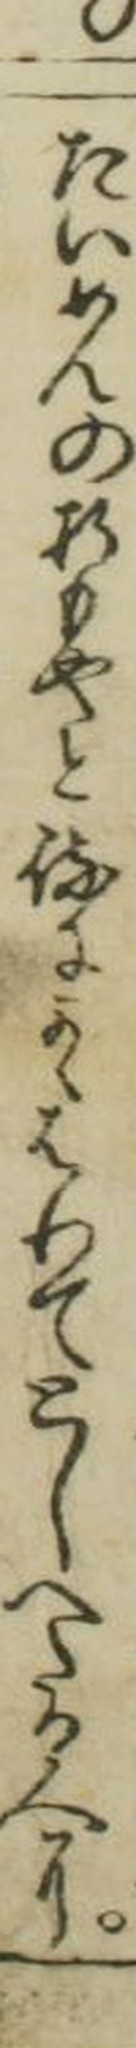たいめんの折もやと待にかゝはりてとしへたる人に。
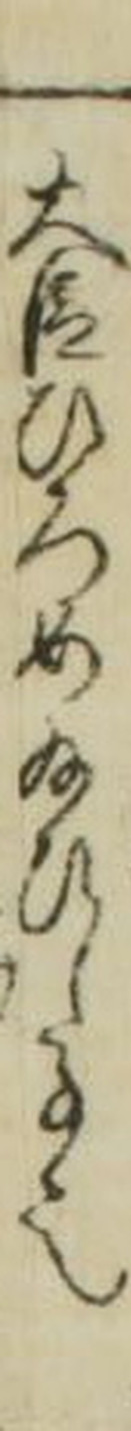大臣ひろめ給ひし事也
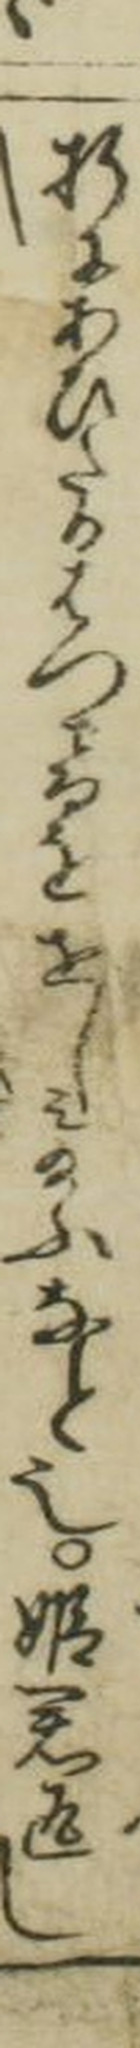折にあひたるはつ音ををしみ給ふなと也。姫君返し
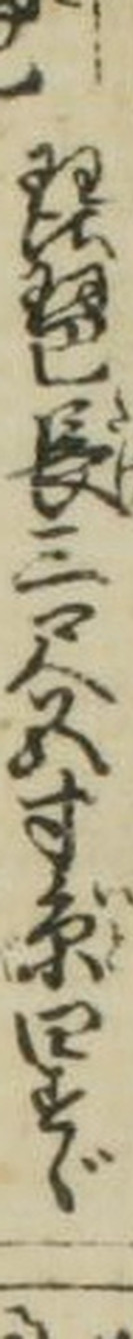琵琶長三尺五寸糸四すじ
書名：女源氏教訓鑑
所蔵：東京学芸大学附属図書館
